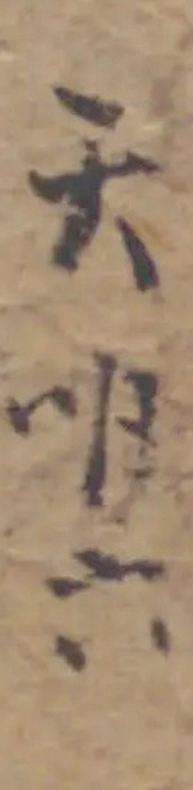天明六

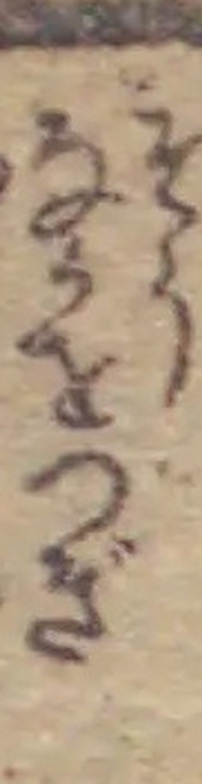なかをつぎ
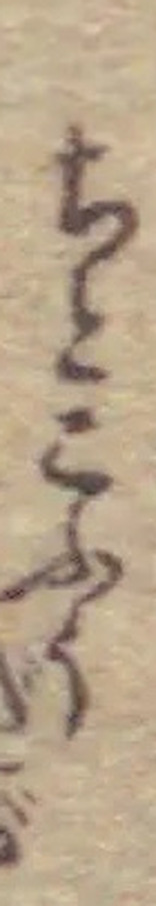ちとこふうだが

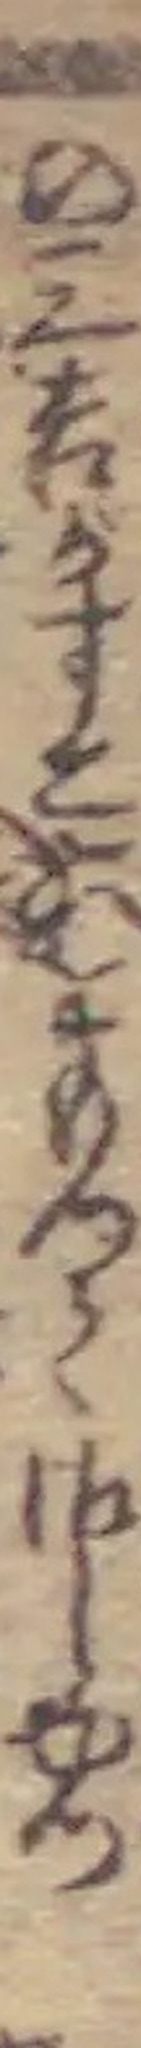の三吉がすこ六をもつて御しゆつ
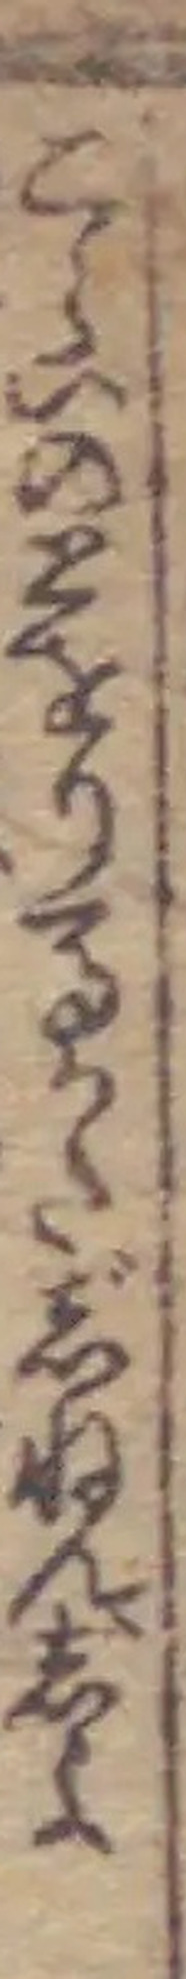こらいのとをり馬かたじねんじよ
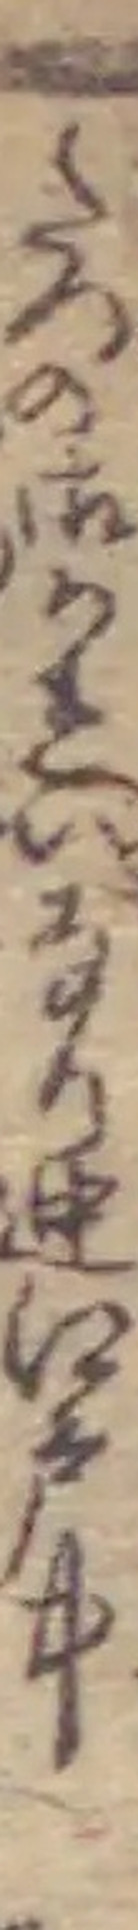たつの御かれいなり迚江戸中
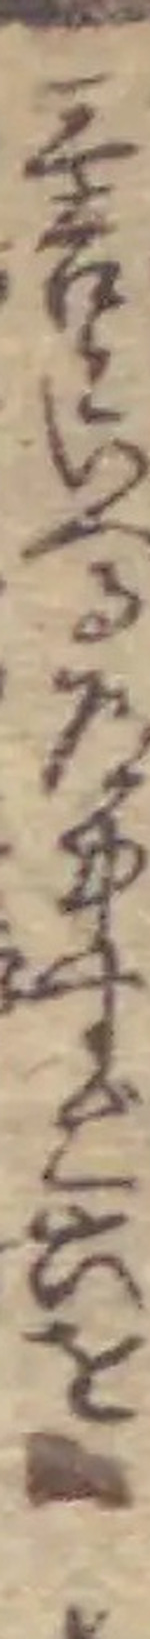三吉といへる道中すご六を
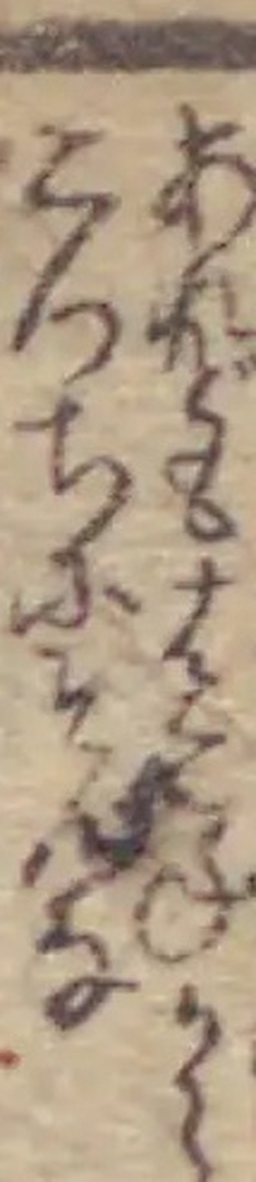こつちにそんな
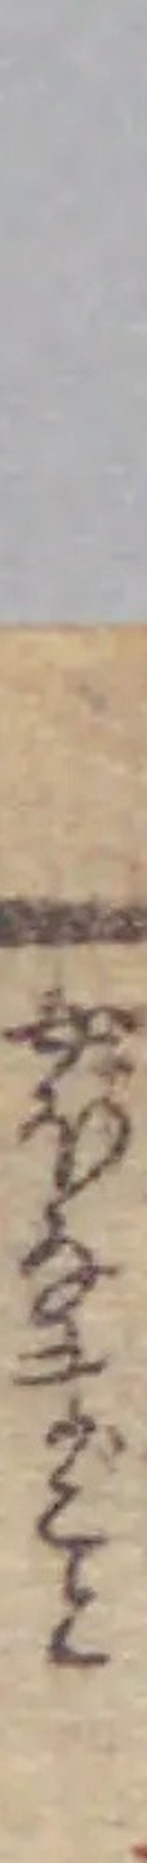やぼなまごと
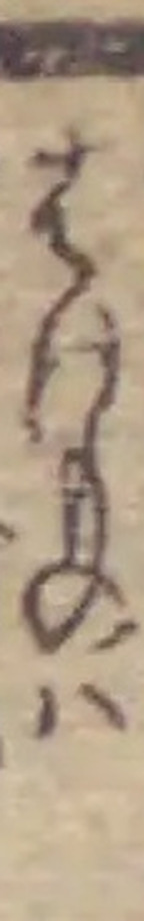はけものは
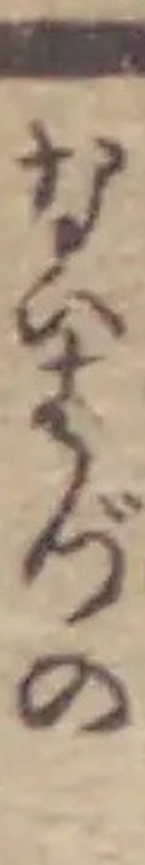ないはづの
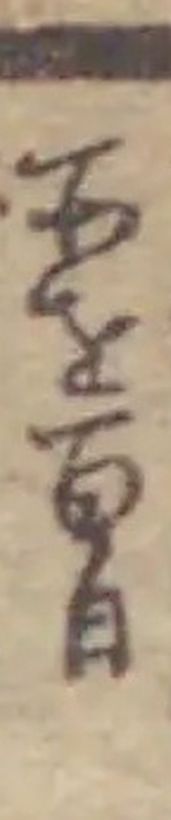所を百日
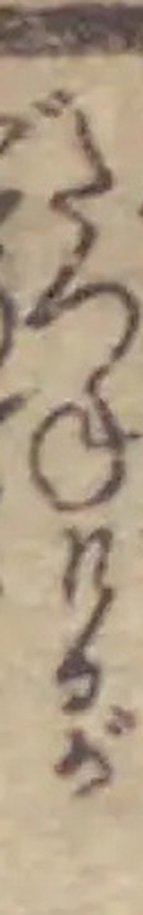たつねけるが
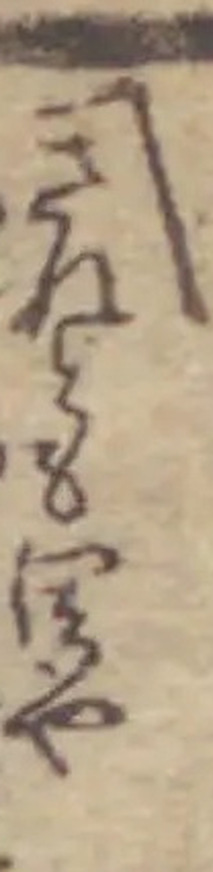〽されとも四ツや
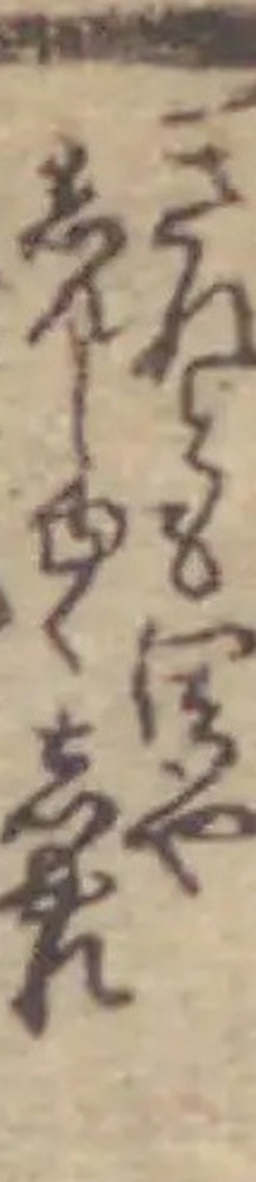しんしゆくしやれ
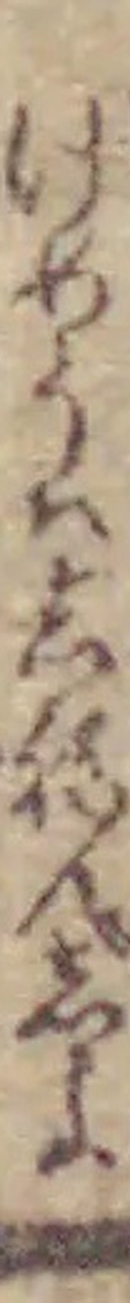けめうはしねんじよ
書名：道笑双六
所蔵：国立国会図書館 National Diet Library, JAPAN
